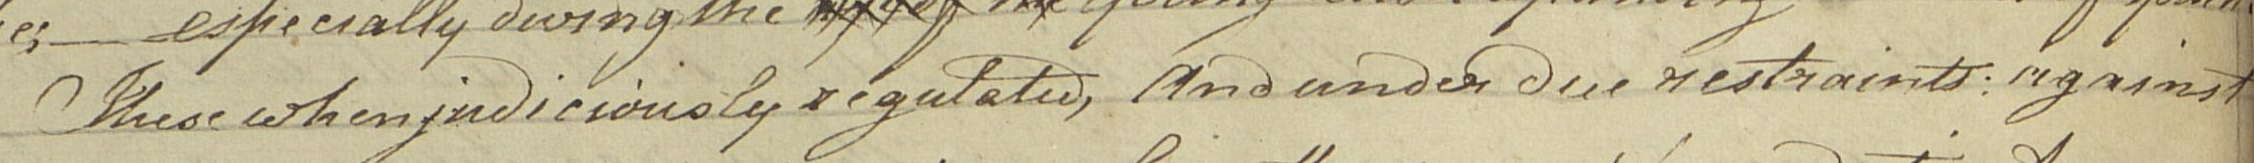These when judiciously regulated, And under due restraints against
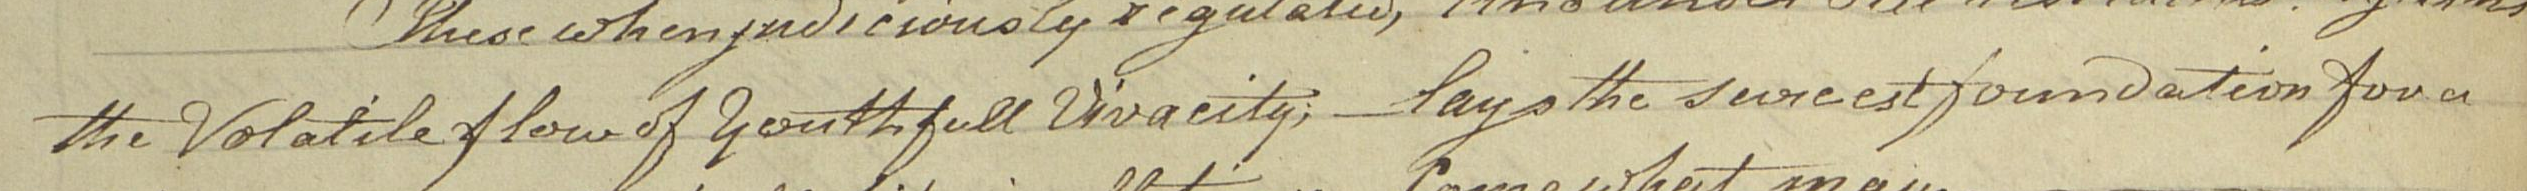the Volatile flow of Youthfull Vivacity; lays the surest foundation for a
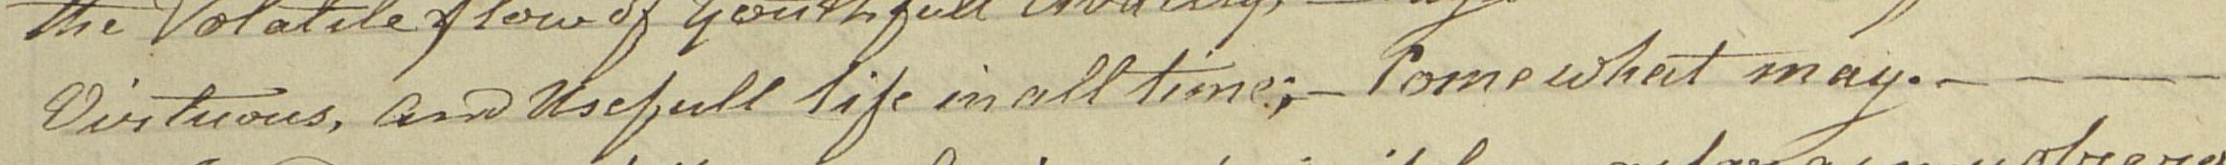Virtuous, and Usefull life in all time; Come what may.
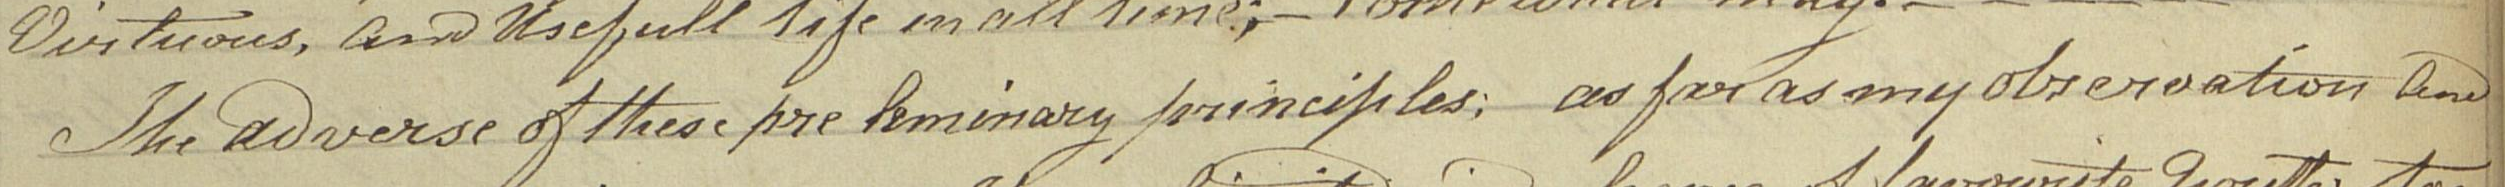The adverse of these preliminary principles; as far as my observation And
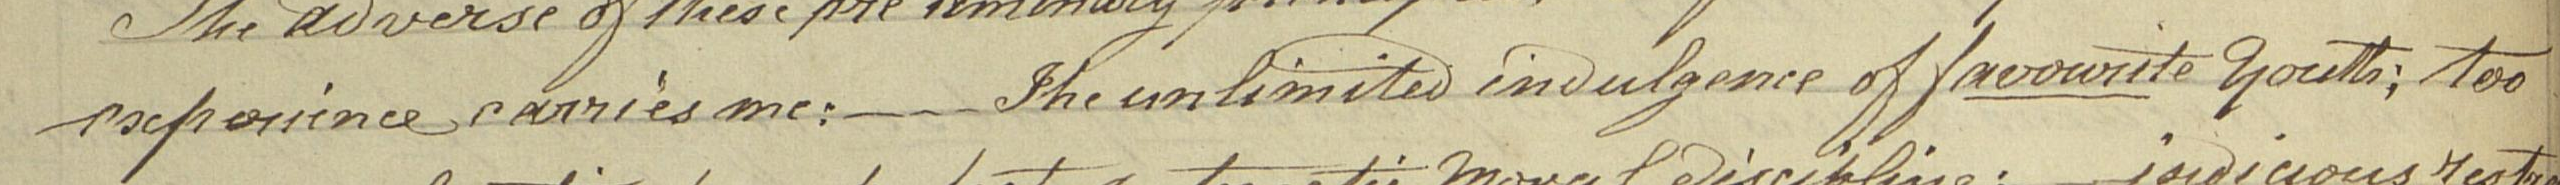expensive carries me: The unlimited indulgence of favourite Youth; too
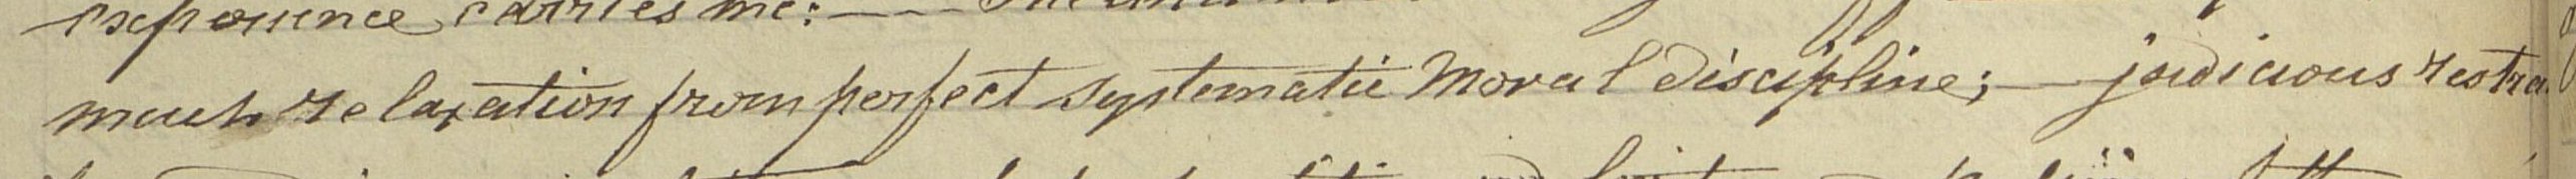much relaxation from perfect systematic moral discipline; judicious restra-
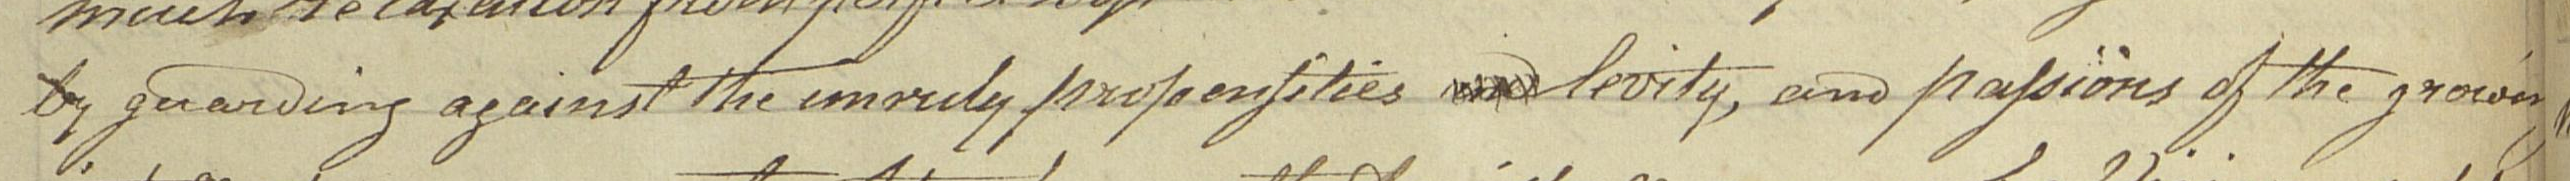by guarding against the unruly propensities [and] levity and passions of the growing
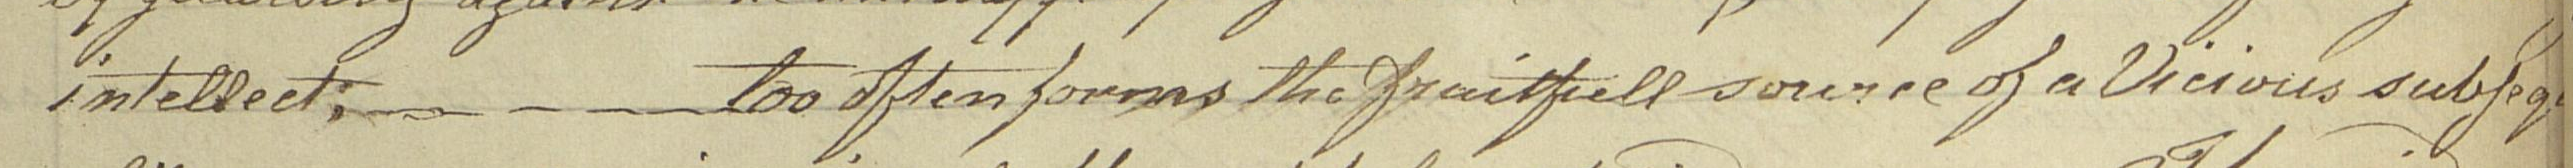intellect; too often forms the fruitfull source of a Vicious subseq-
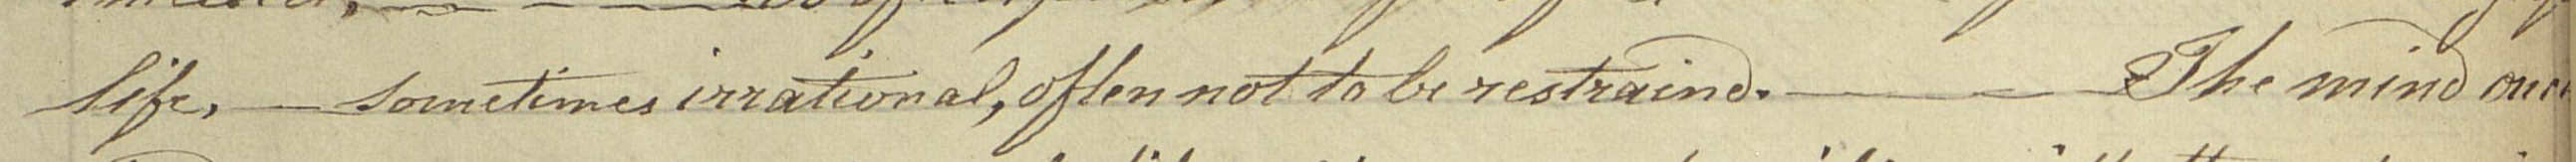life, sometimes irrational, often not to be restraind. The mind once
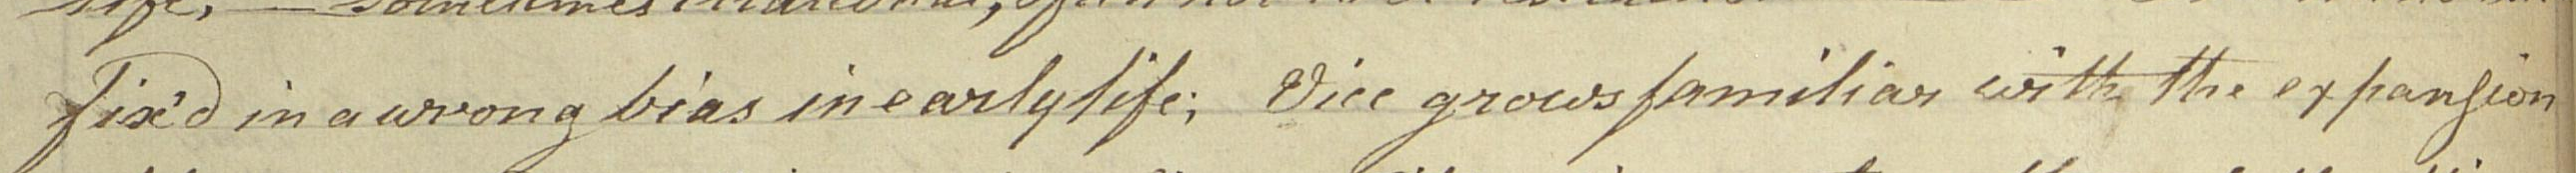fix'd in a wrong bias in early life; Vice grows familiar with the expansion
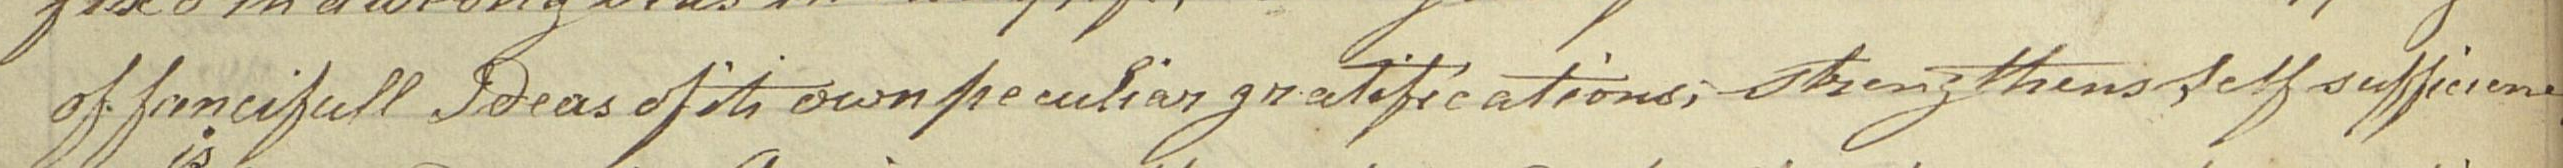of fancifull Ideas of its own peculiar gratifications; strengthens self sufficienc-
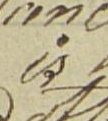is
